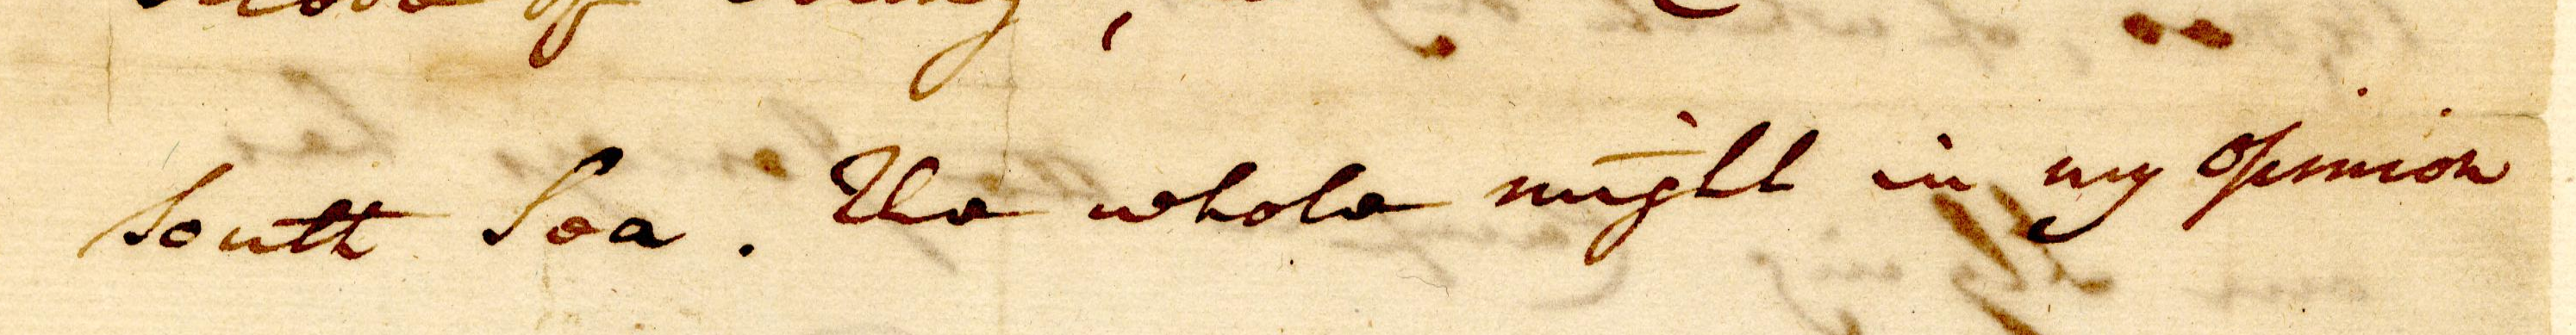South Sea. The whole night in any opinion
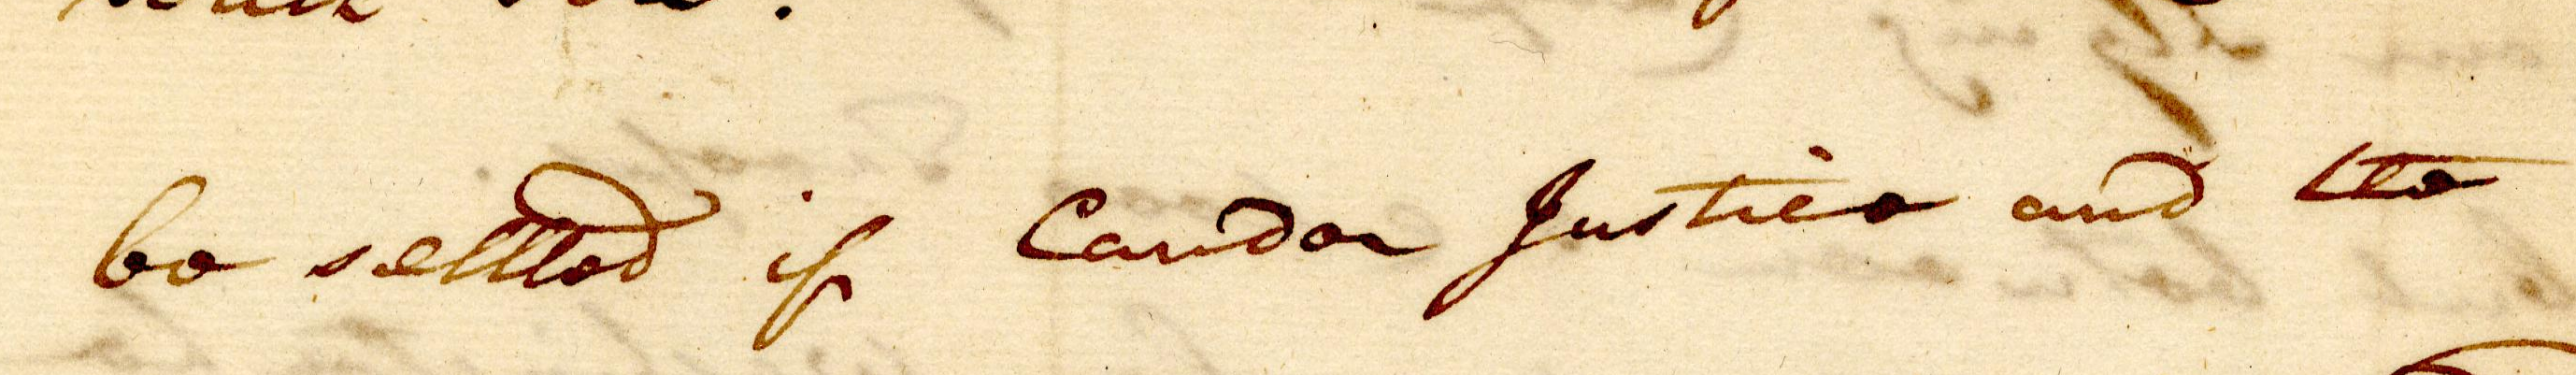be settled if Candor Justice and the
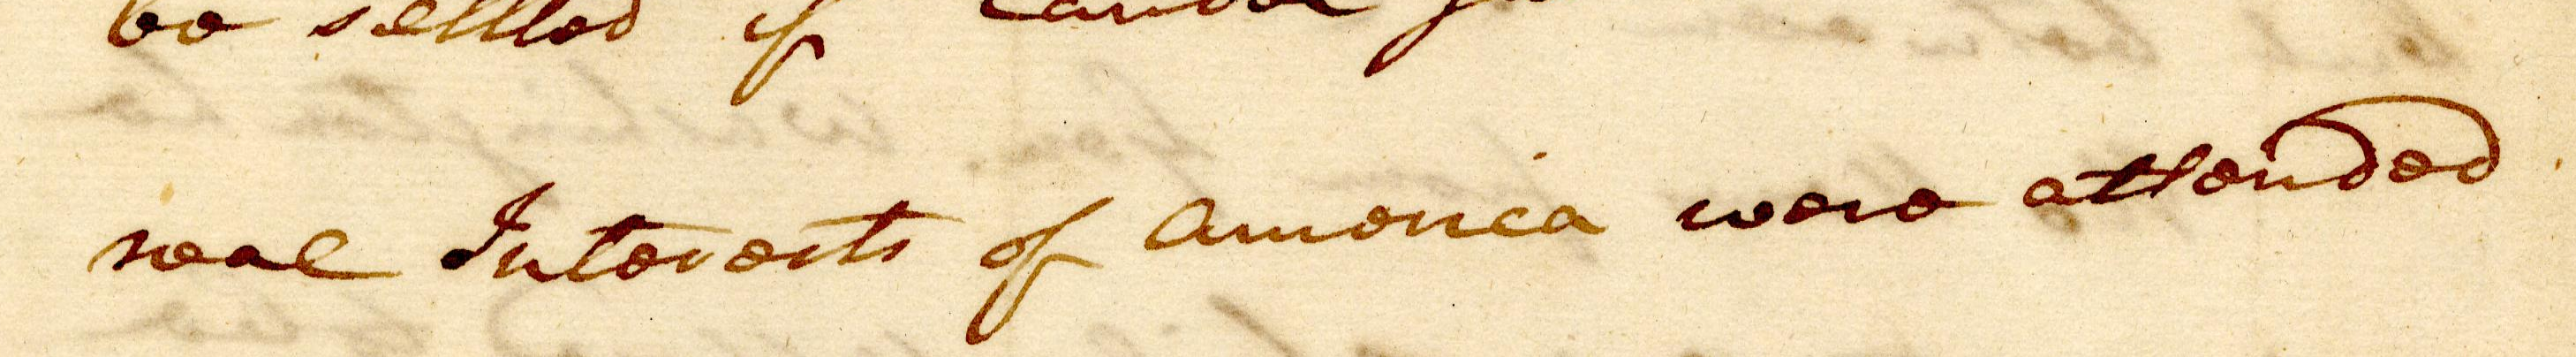real Interests of America were attended
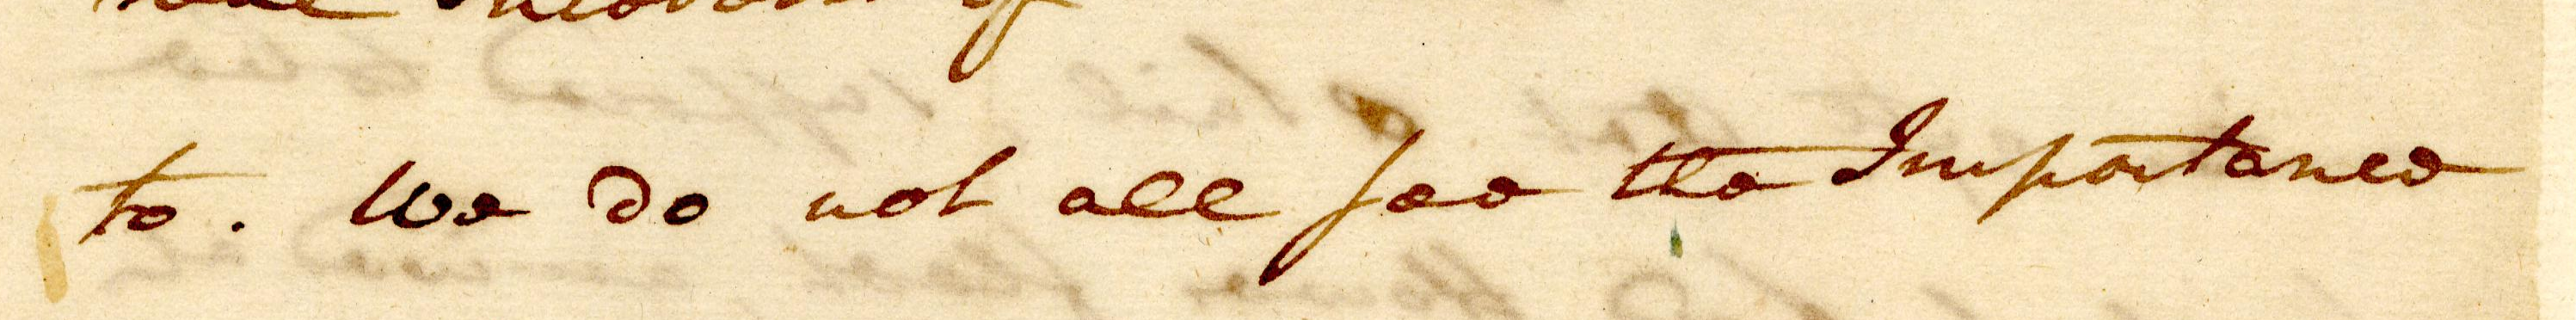to. we do not all see the Importance
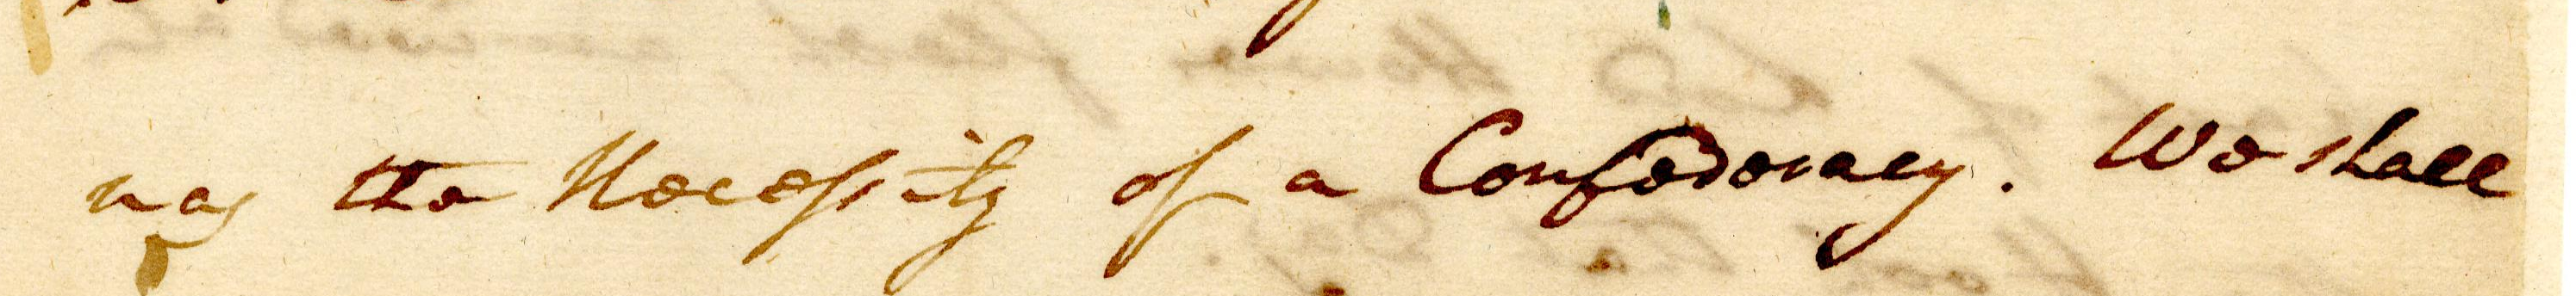as the necessity of a Confederacy. We shall
